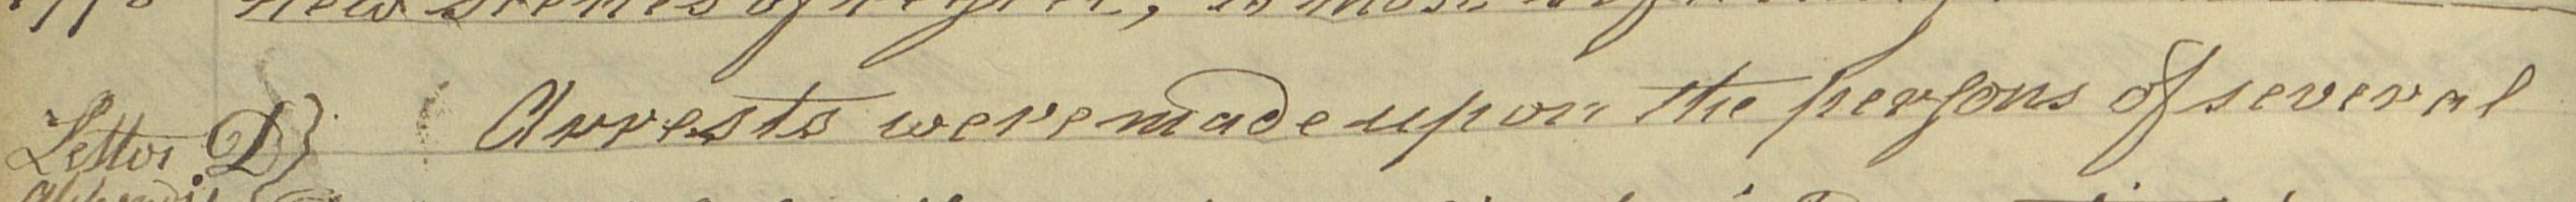Letter D Arrests were made upon the persons of several
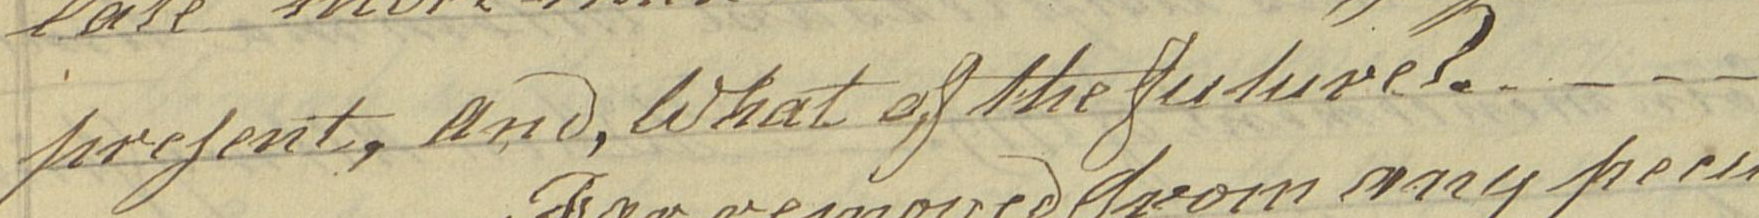present, and, What of the future?
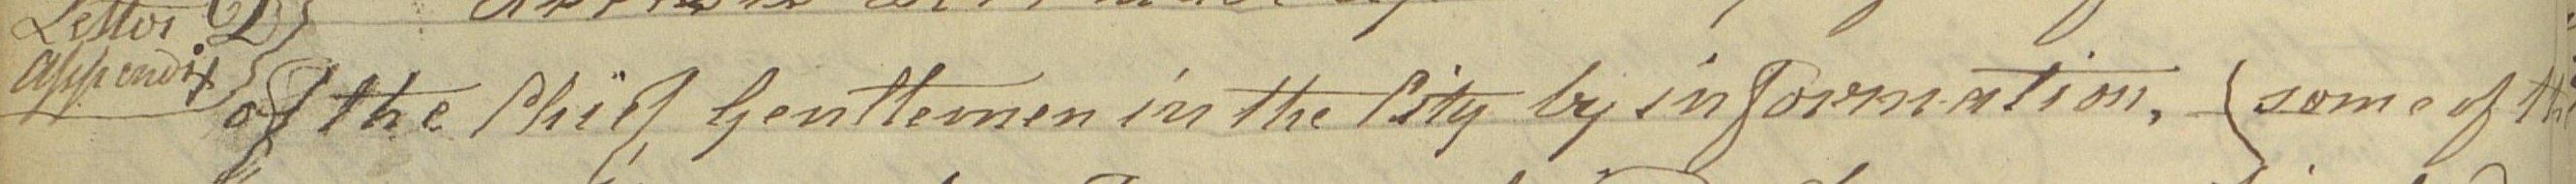Appendix of the Chief Gentlemen in the City by information, (some of the
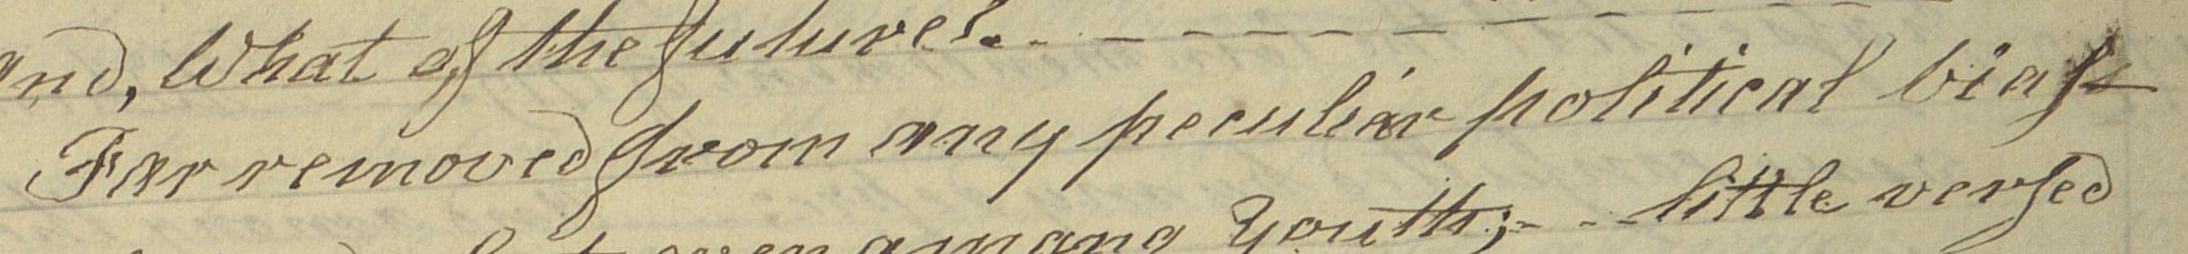Far removed from my peculiar political bias
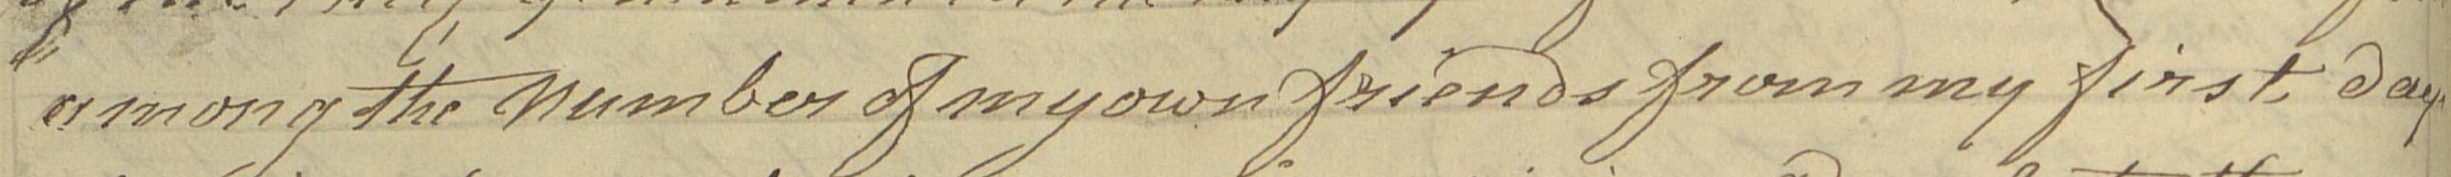among the number of my own friends from my first day
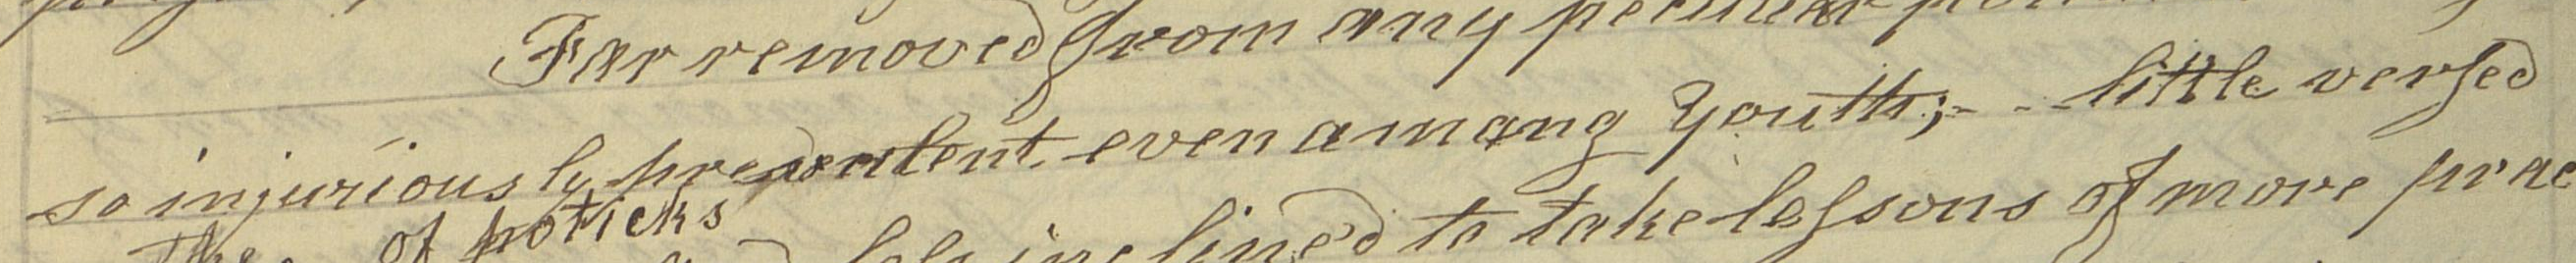so injuriously prevalent even among Youths; little versed
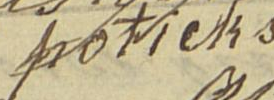poticks
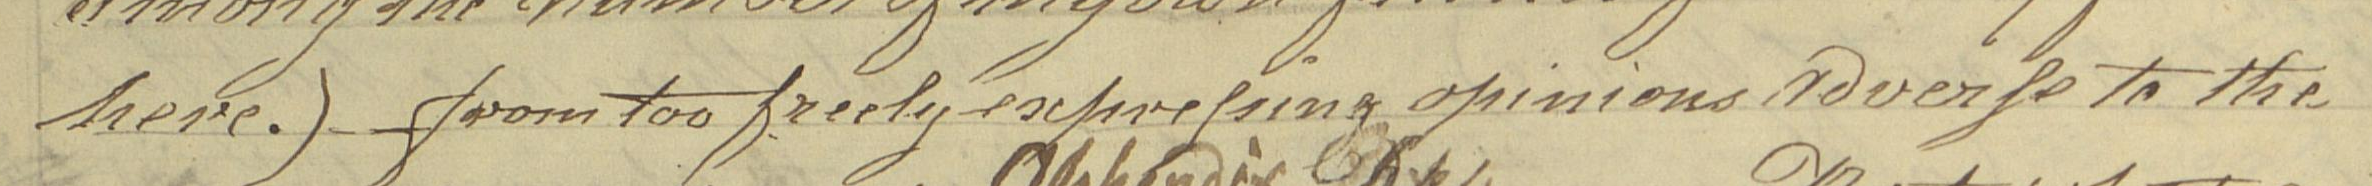here.) from too freely expressing opinions adverse to the
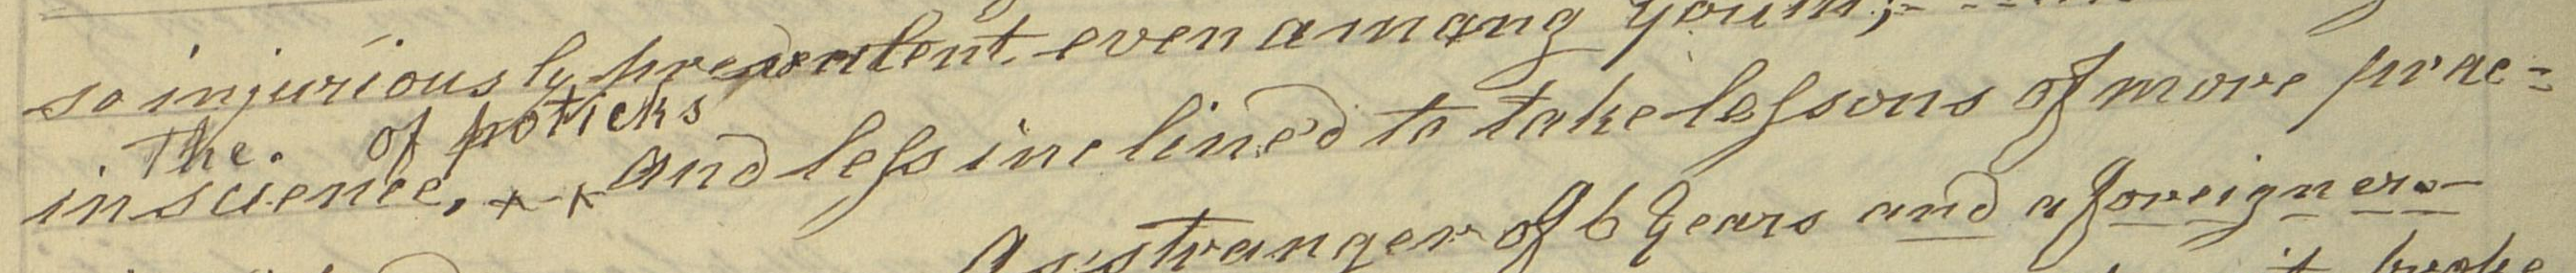in science, ^ ^ and less inclined to take lessons of more prac-
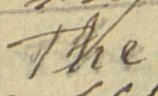the
